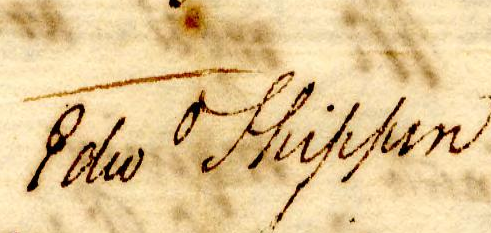Edw^d Shippen
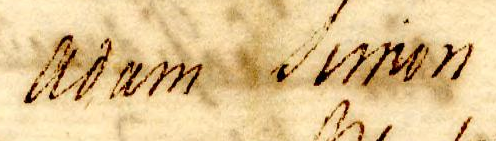Adam Simon
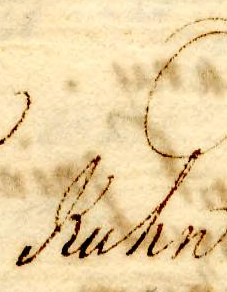Kuhn
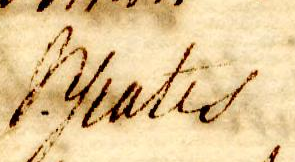J. Yeates
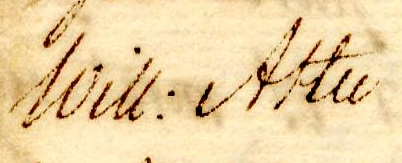Will: Atlee
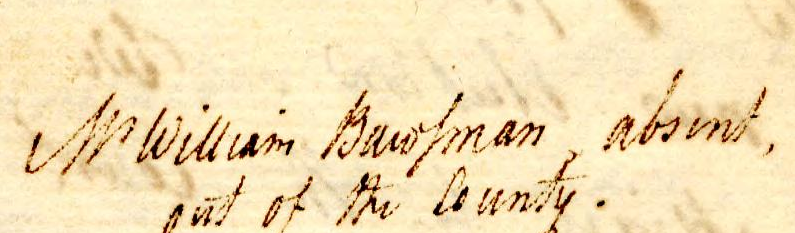M^r William Bawfman absent
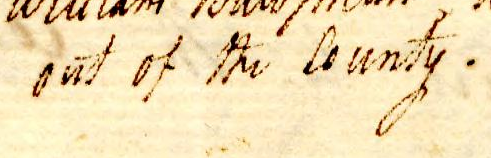out of the Country.
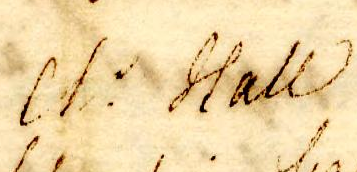Ch^s. Hall
